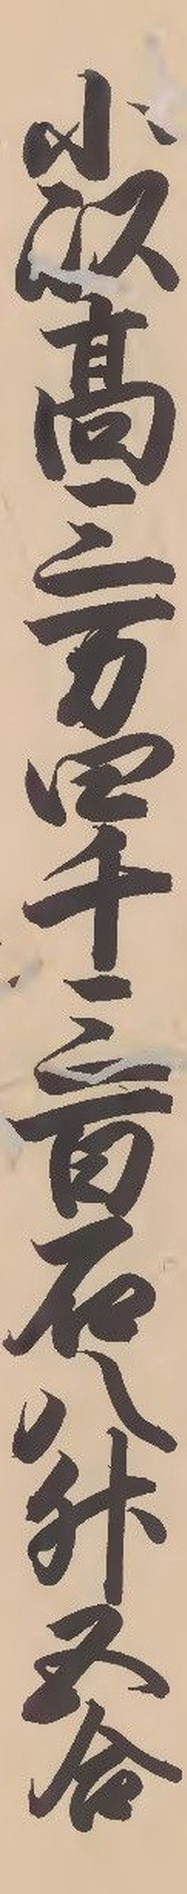小以高三万四千三百石八升五合
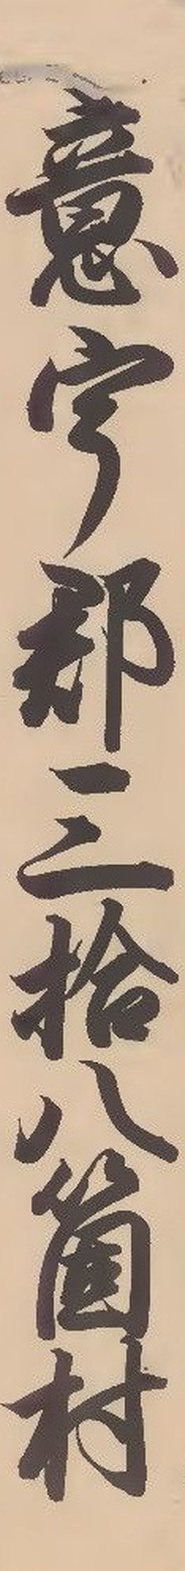意宇郡三拾八箇村
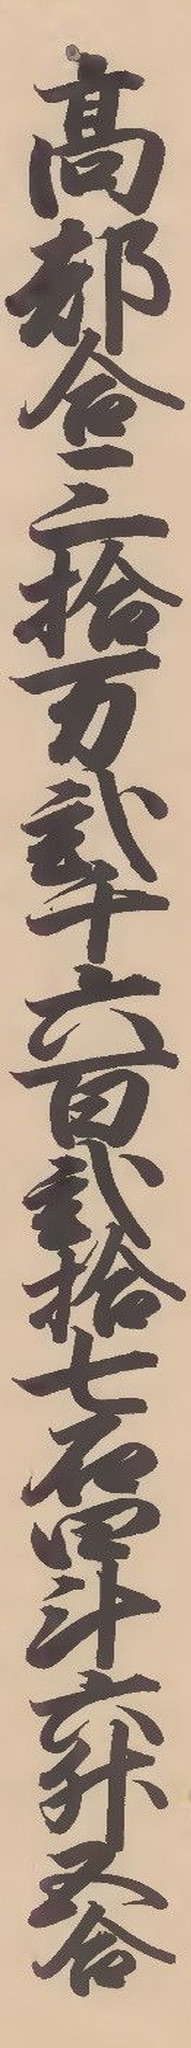高都合三拾万弐千六百弐拾七石四斗六升五合
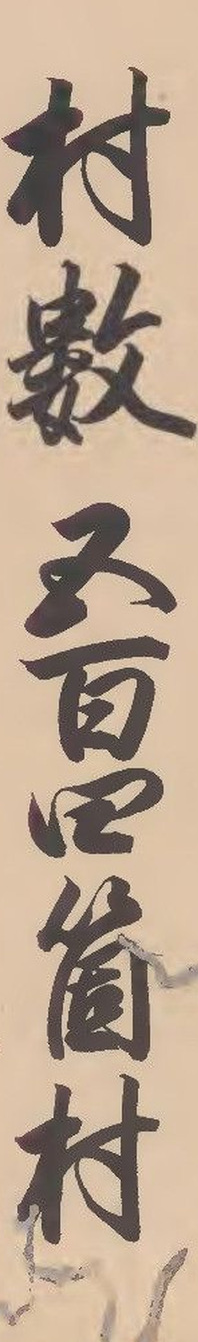村数五百四箇村

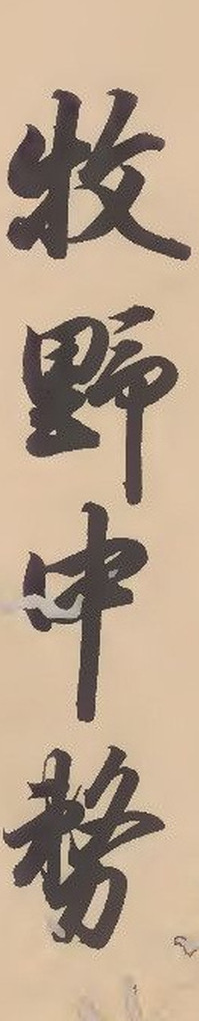牧野中務
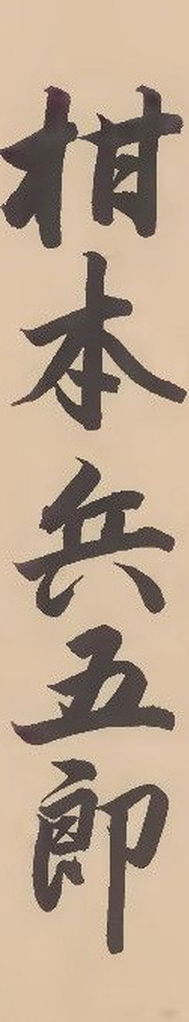柑本兵五郎
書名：出雲国郷帳
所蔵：国立公文書館 National Archives of Japan
